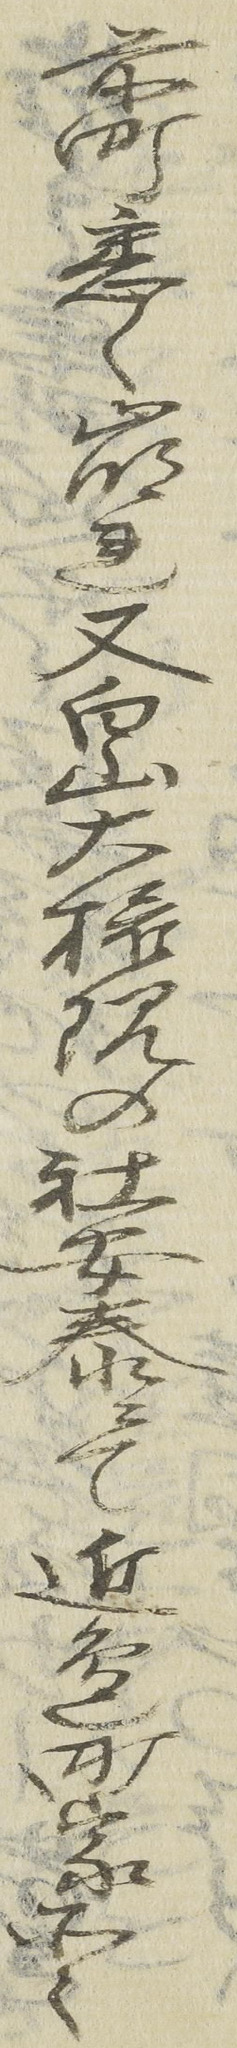前町悉く崩れ又白山大権現の社安泰ニて近辺町家所々

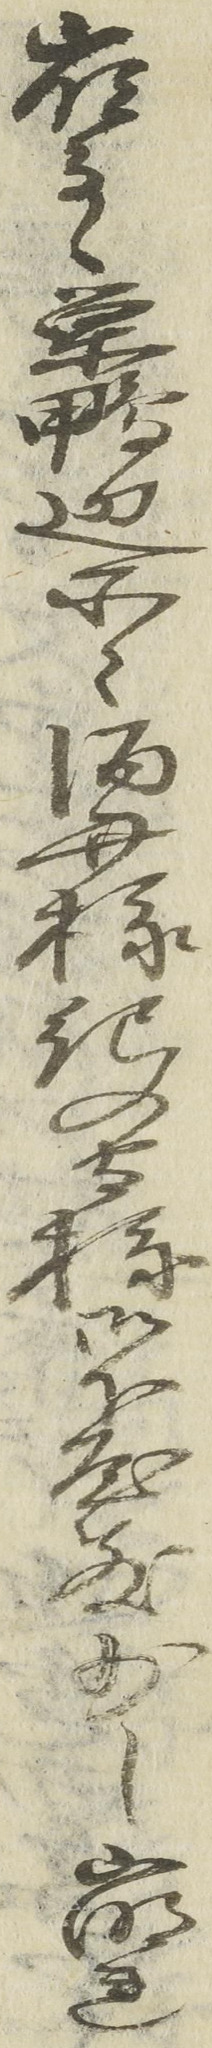崩るゝ巣鴨辺所〻酒井様紀の守様御下屋敷少し崩れ
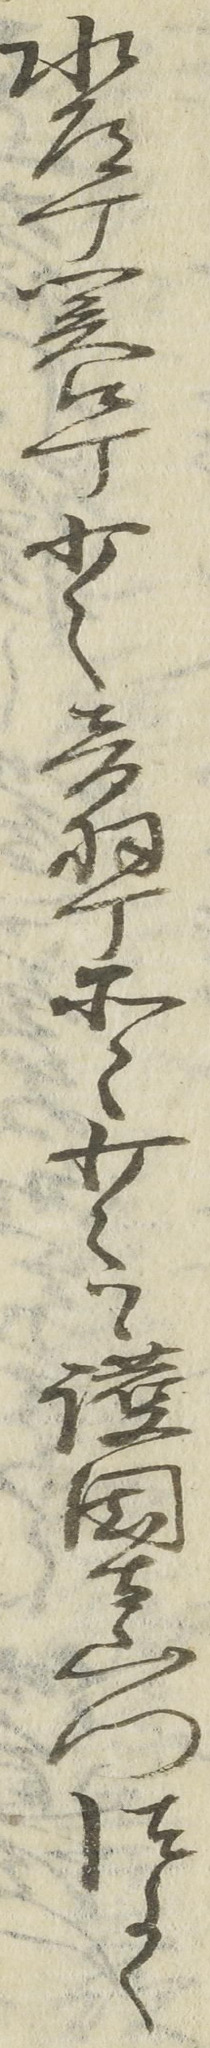水道丁関口丁少し音羽丁所〻少しツヽ護国寺山門つよく
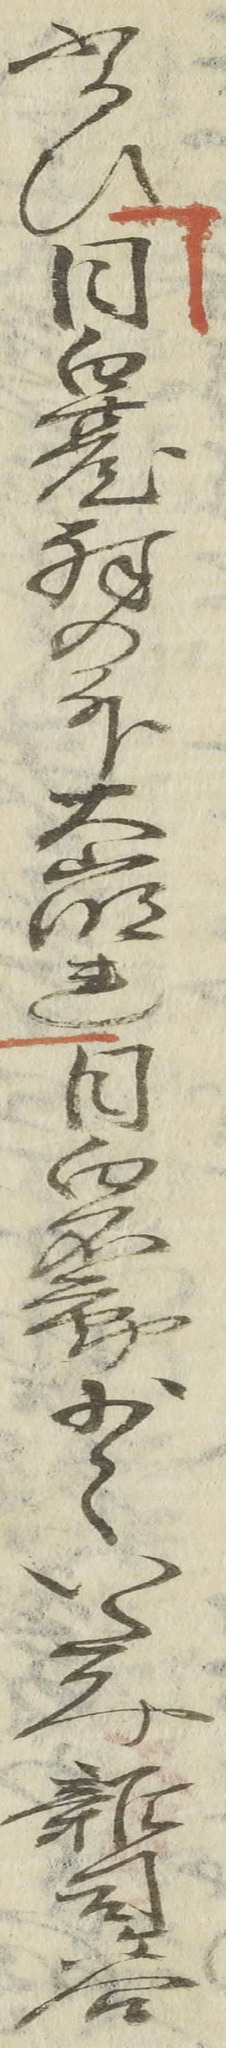ふるひ目白台殊の外大崩れ目白不動少しいたみ雑司ヶ谷
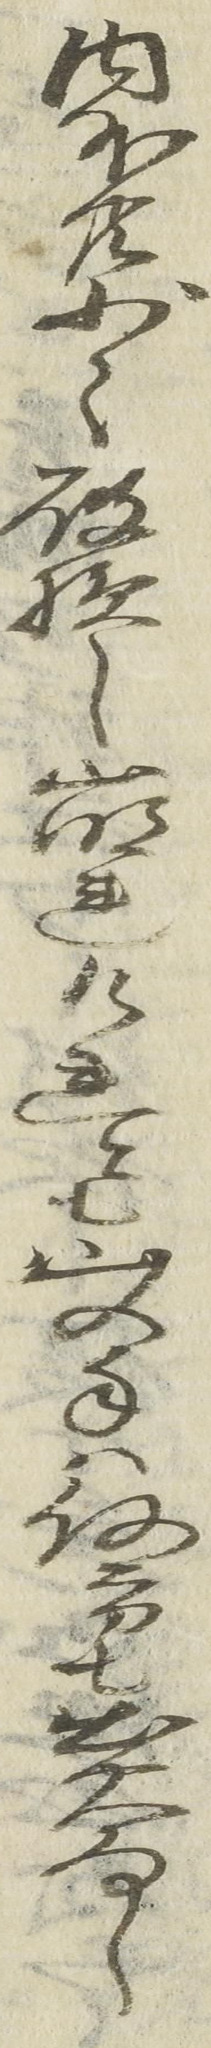内外共少し破損し崩れケれとも山の手ハ何方も出火なし
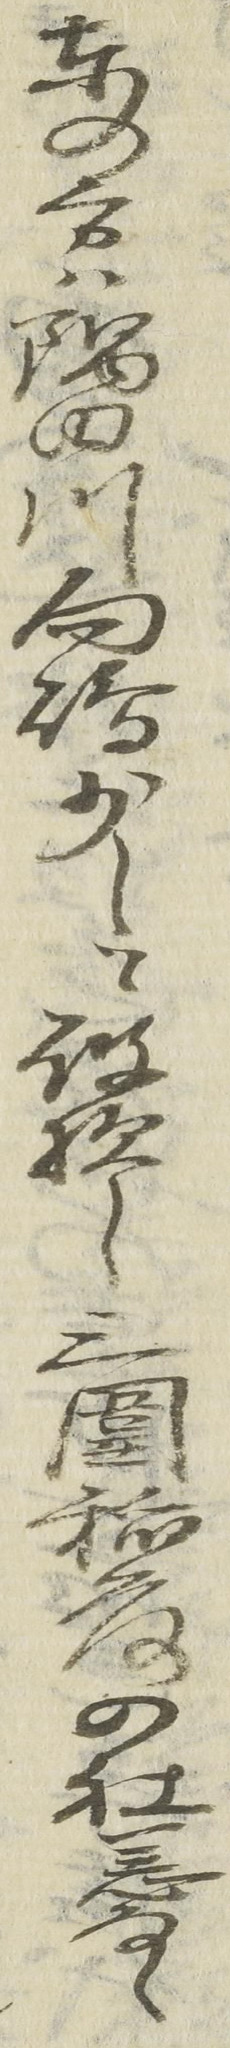東の方ハ隅田川向嶋少しツヽ破損し三囲稲荷の社恙なく
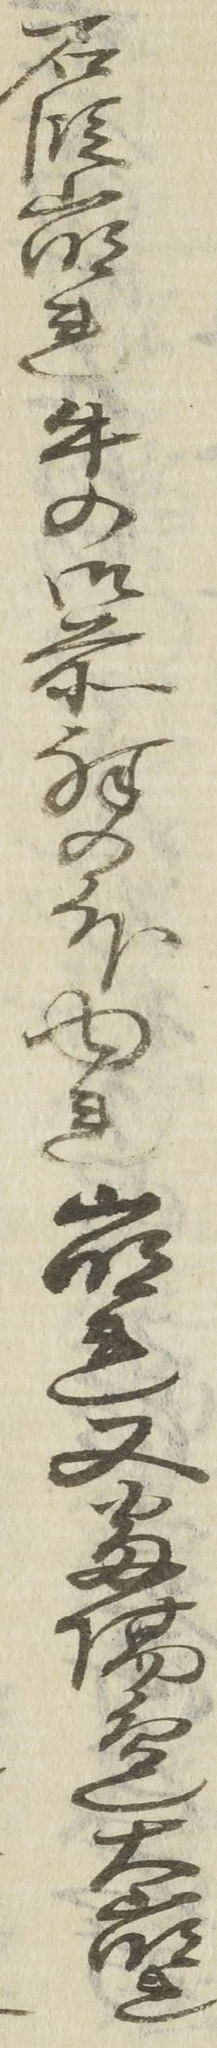石段崩れ牛の御前殊の外ゆれ崩れ又番場辺大崩れ
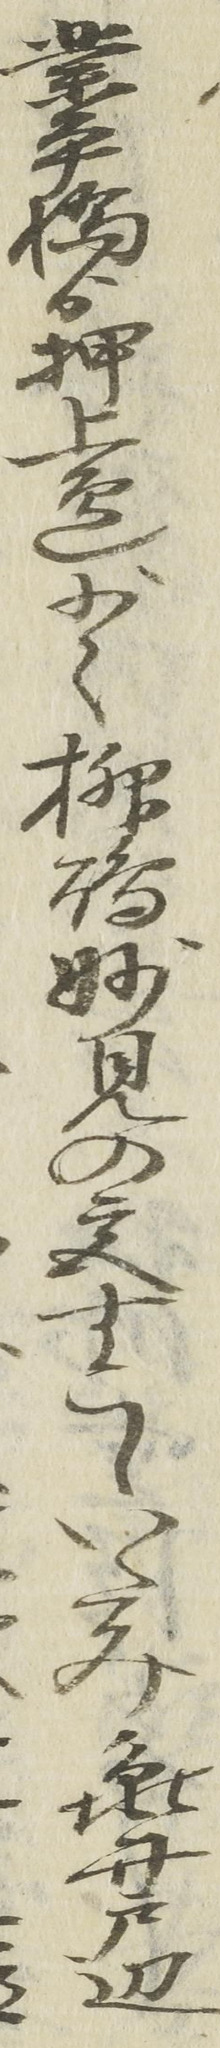業平橋ゟ押上辺少し柳嶋妙見の宮すこしいたみ亀井戸辺
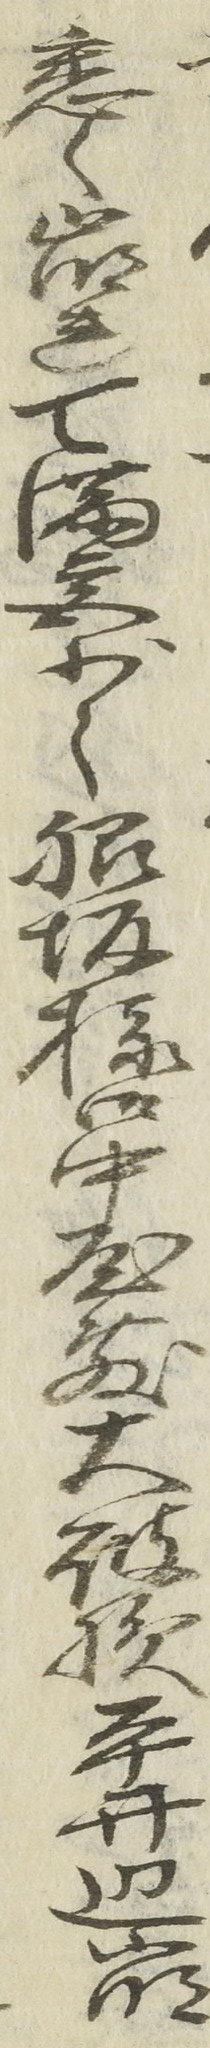悉く崩れ天満宮少し脇坂様御中屋敷大破損平井辺崩
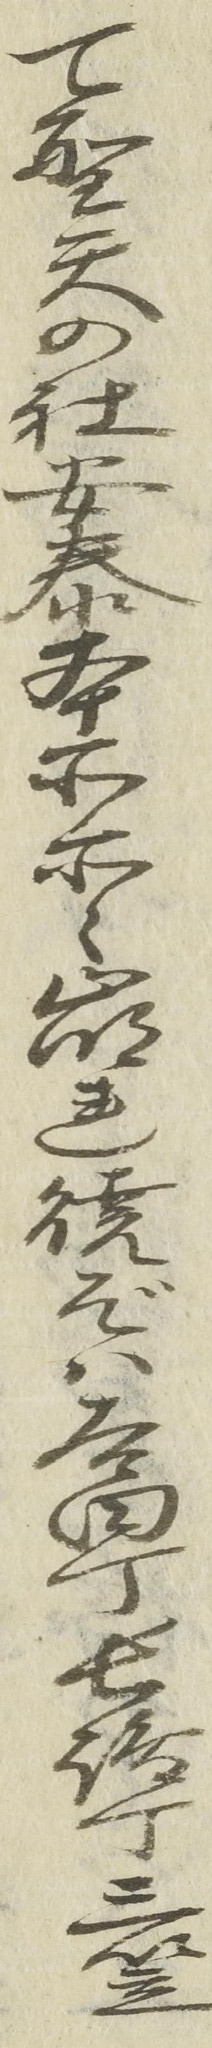て聖天の社安泰本所所〻崩れ焼ばハ太田丁長崎丁三笠
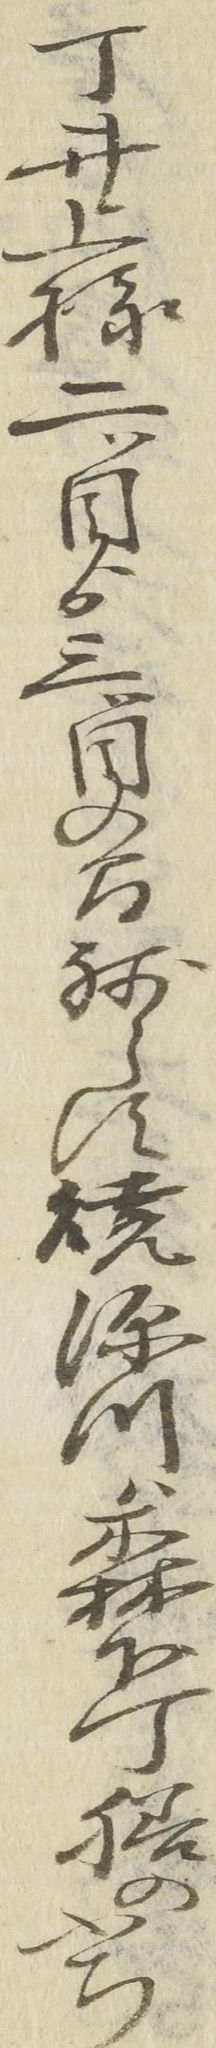丁井上様二ツ目ゟ三ツ目の間残らす焼深川ハ森下丁膳のふち
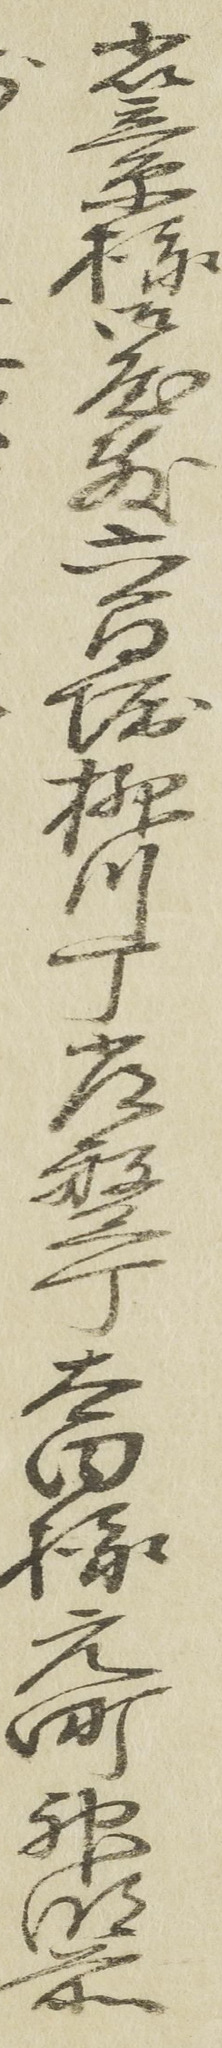小笠原様御屋敷六間堀柳川丁常盤丁太田様元町神明前
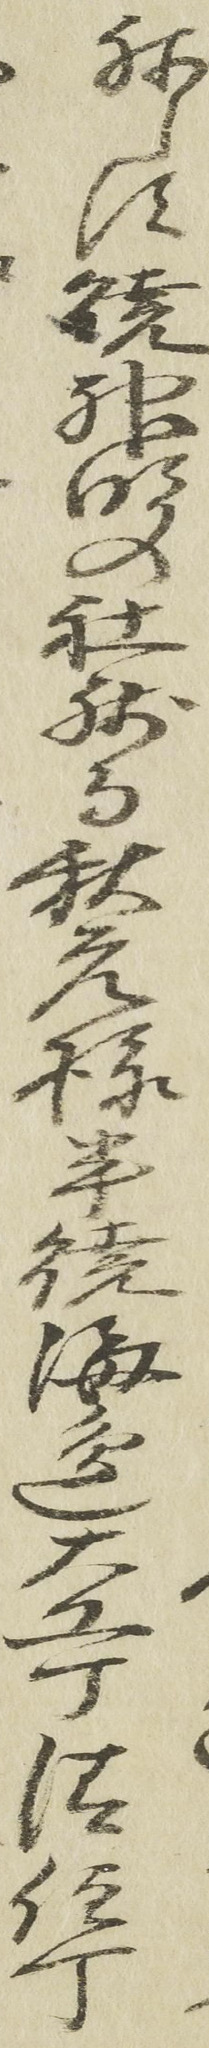残らす焼神明の社残る秋元様半焼海辺大工丁御徒丁
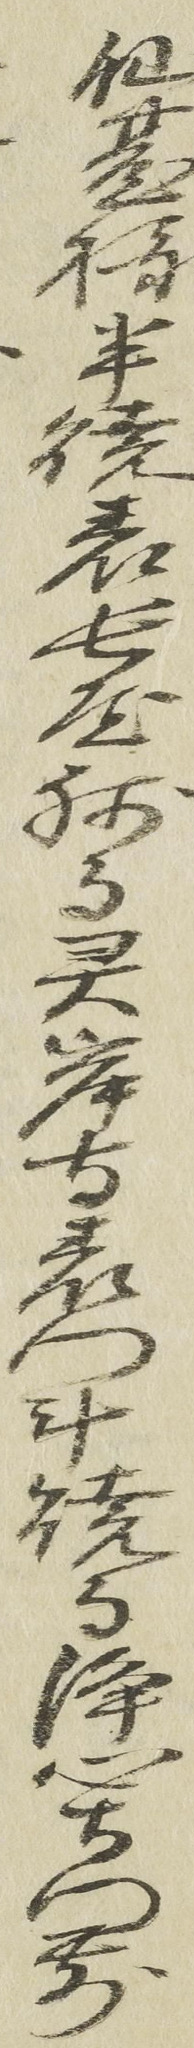仙台様半焼表長屋残る霊岸寺表門斗焼る浄心寺門前
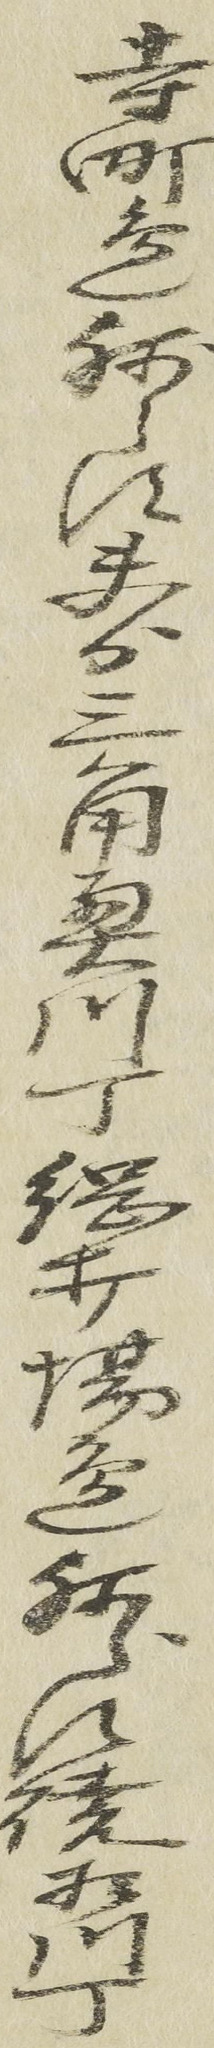寺町辺残らす夫ゟ三角魚川丁綱打場辺残らす焼相川丁
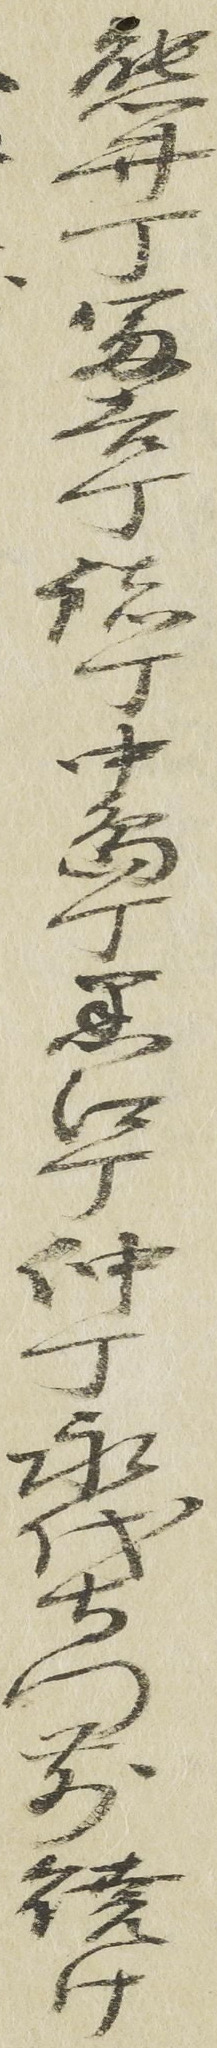熊井丁富吉丁諸？丁中島丁黒江丁仲丁永代寺門前焼け
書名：安政乙卯江戸大地震筆記　安政丙辰八月大阪大雷雨之記追加　安政三辰年七月松前辺大地震并八月大風雨記録
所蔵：東京大学地震研究所図書室 Earthquake Research Institute Library, The University of Tokyo, JAPAN
